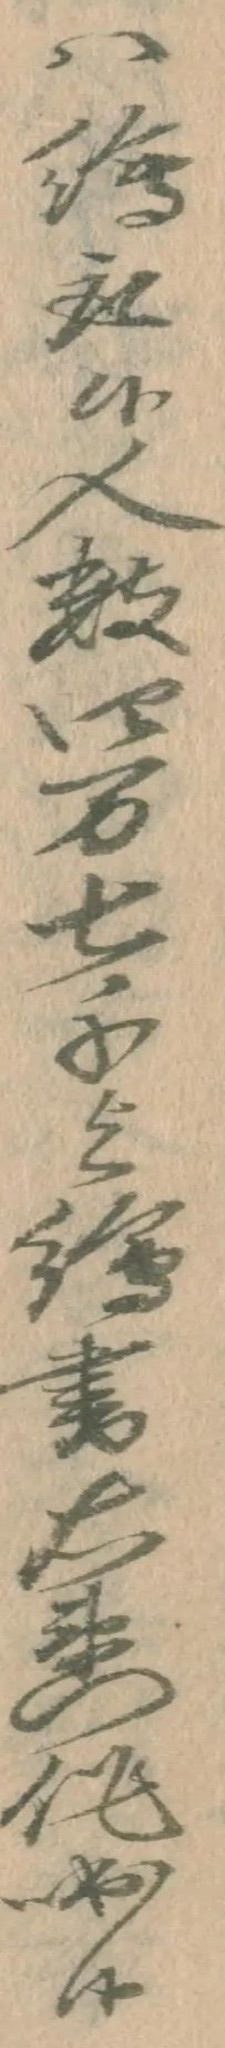は絵取候人数四万七千与絵書右衛門咄候
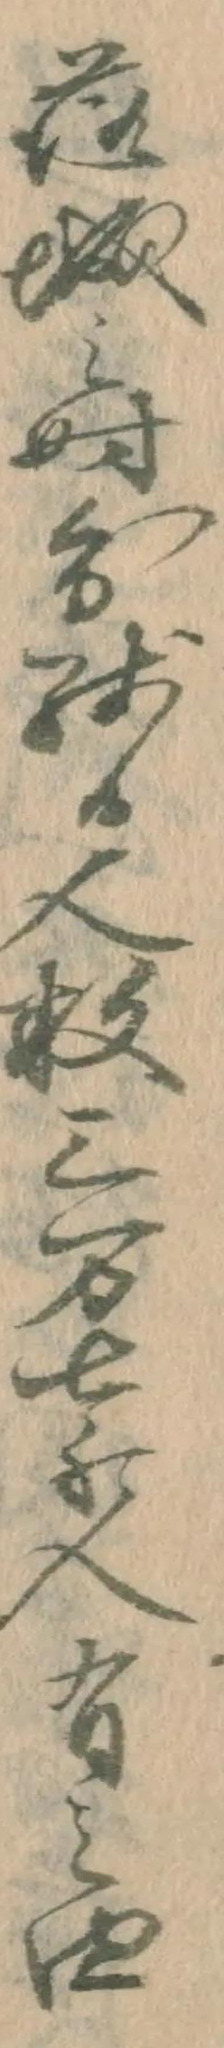落城之時分残る人数三万七千人有之由
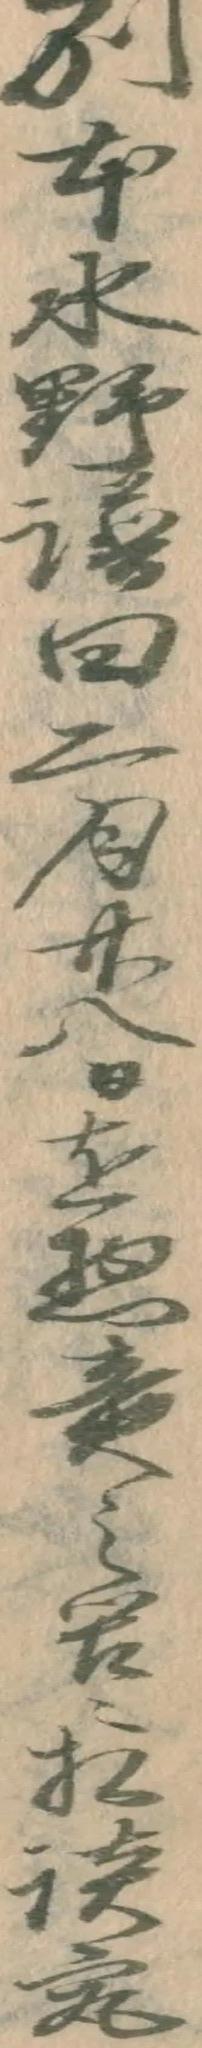別本水野譜曰二月廿八日を惣責之筈に相談究
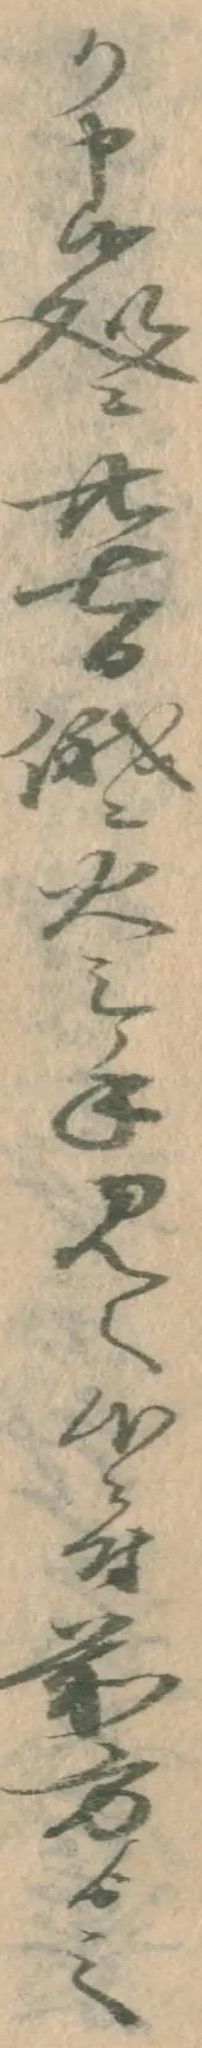り申候処に廿七日俄に火之手見へ候に付前方ゟ之
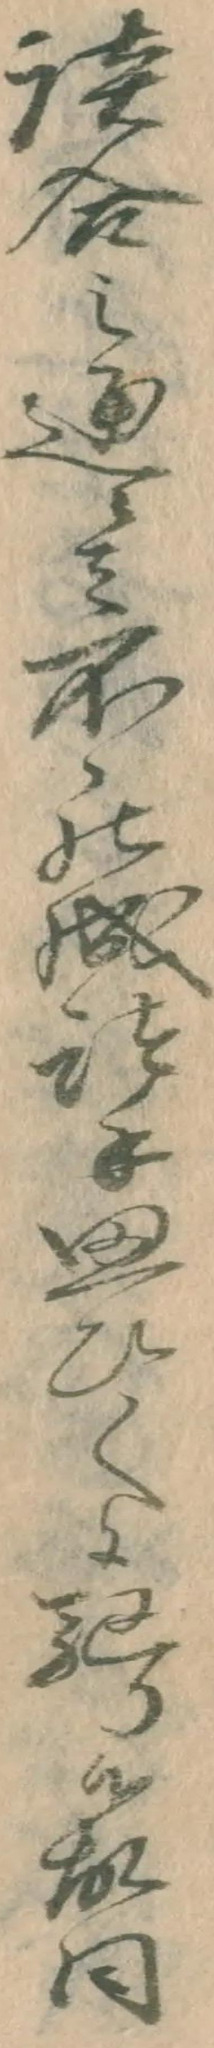談合之通に者不罷成諸手思ひ〳〵尓駆り候故同
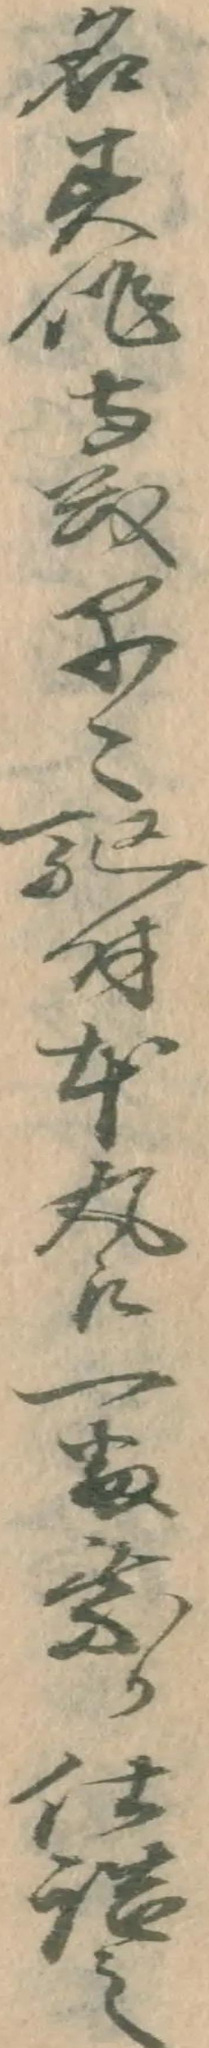名美作守茂早々駆付本丸江一番乗り仕詰之

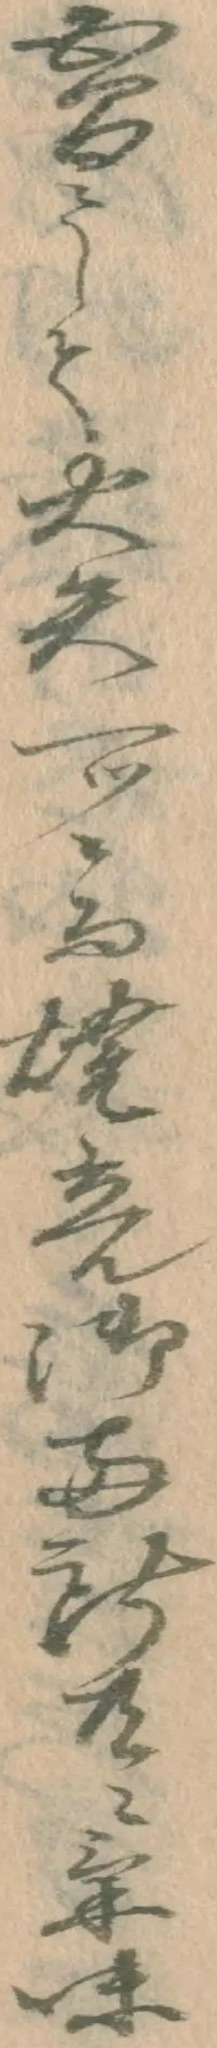五間にして火矢一つに而焼立る御両所共に気味
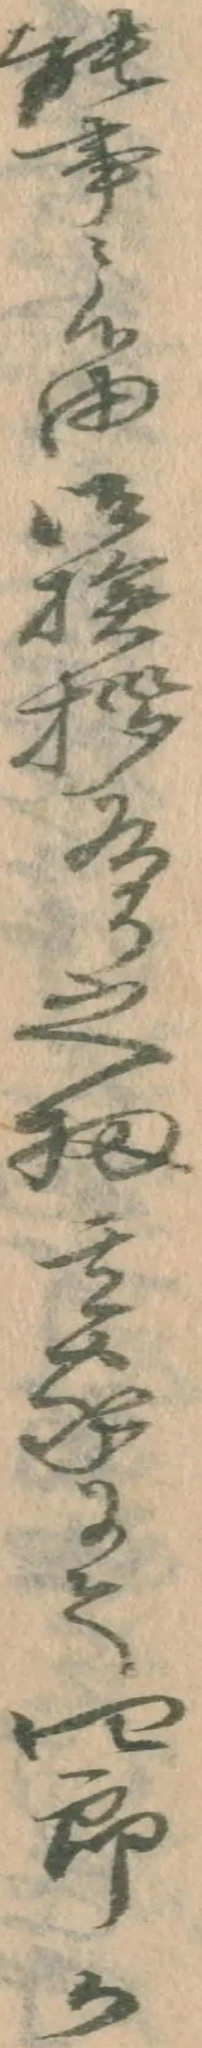能事に候由御挨拶有り之扨其家尓て四郎か
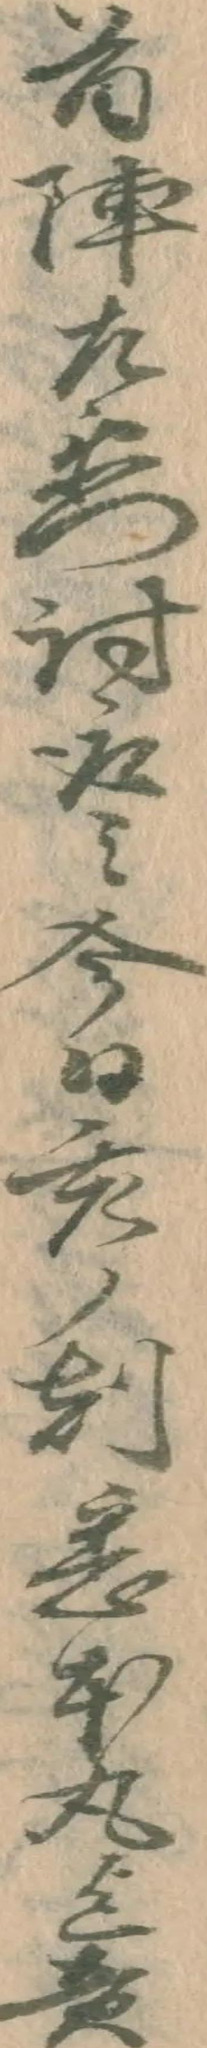首陣左衛門討取之今日亥之刻悉本丸迄責
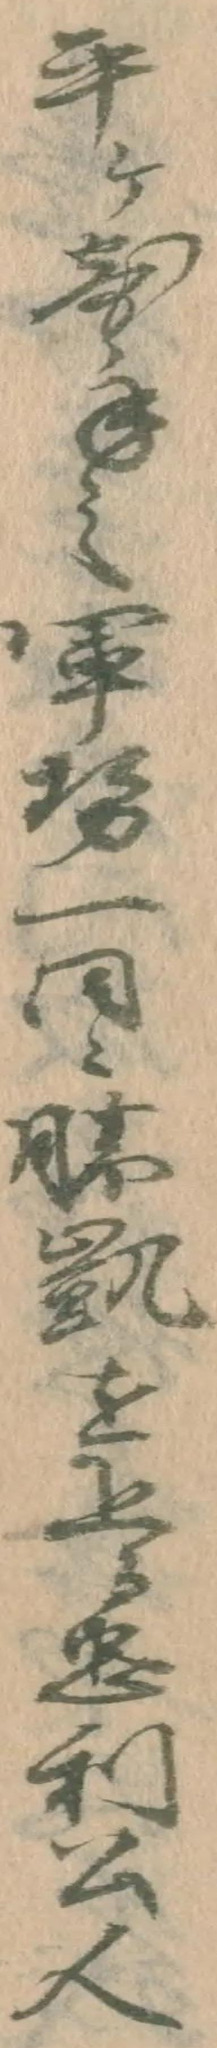平け寄手之軍勢一同に勝凱を止る忠利公人
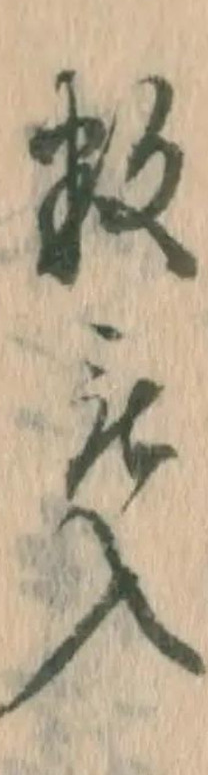数被入
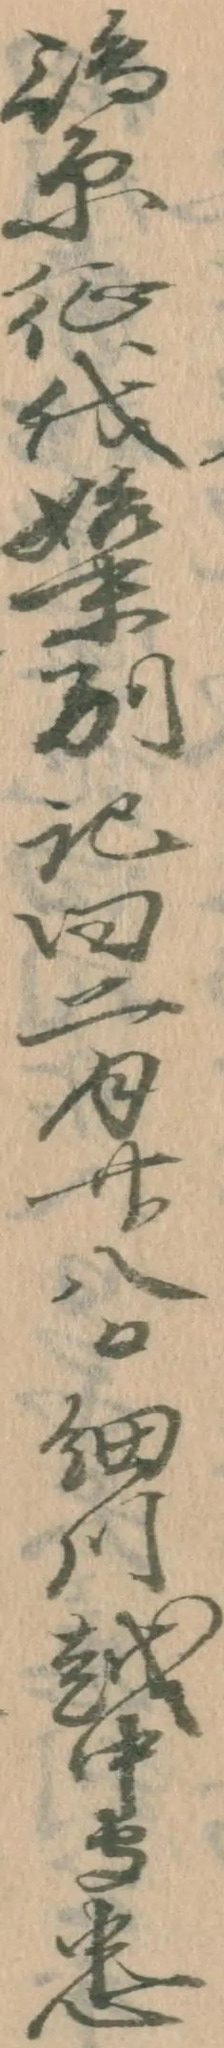島原征伐始末別記曰二月廿八日細川越中守忠
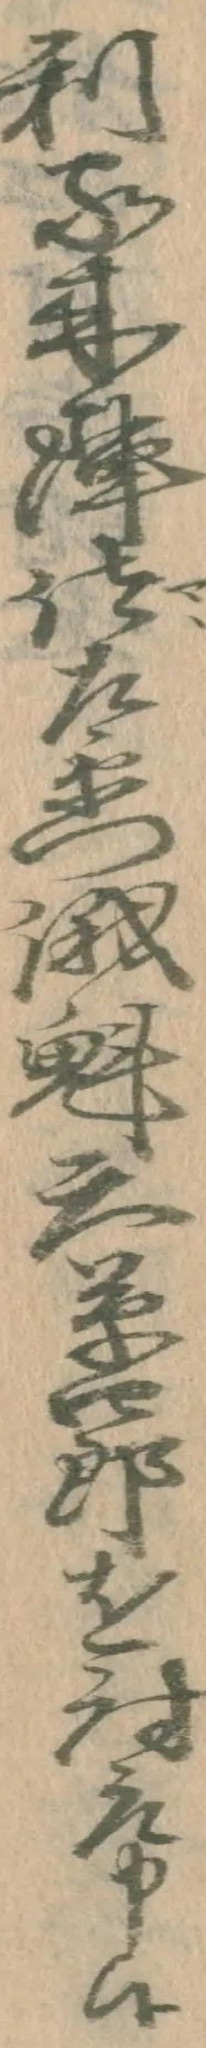利家来陣佐左衛門俄魁天草四郎を討取申候
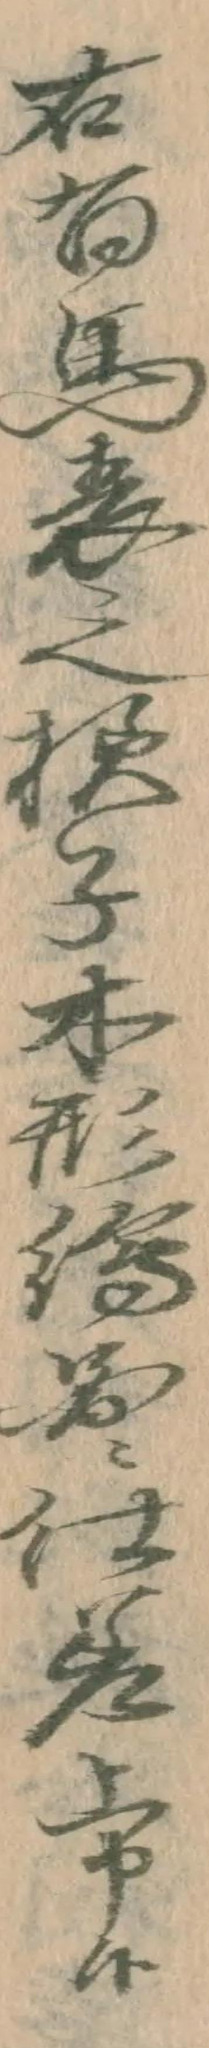右有馬表之様子木形絵図に仕差上申候
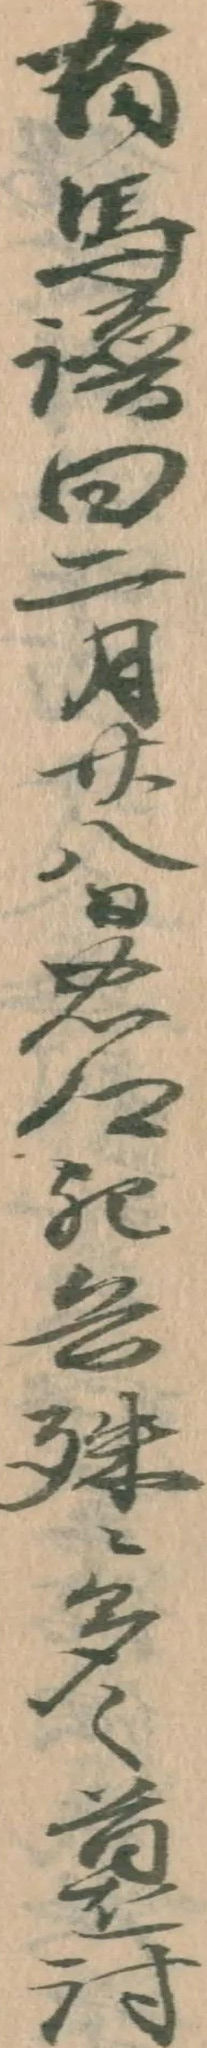有馬譜曰二月廿八日忠郷歟各殊に多く首を討
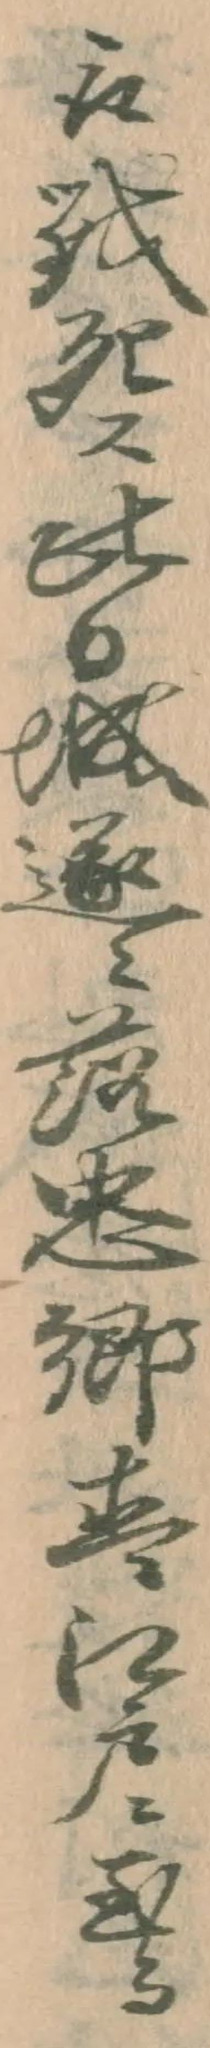取戦死す此日城遂に落忠郷直に江戸に至る
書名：切支丹御退治記 49巻. [8]
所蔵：国立国会図書館 National Diet Library, JAPAN
